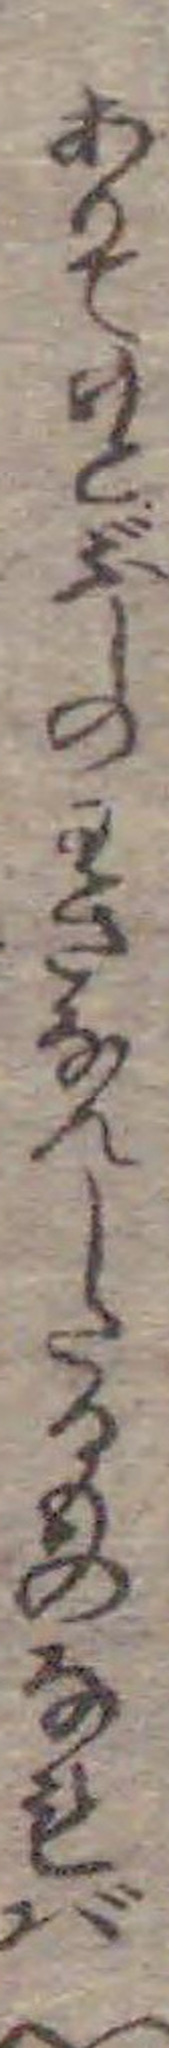ありてもとぶしのわさなんしたるものなれば
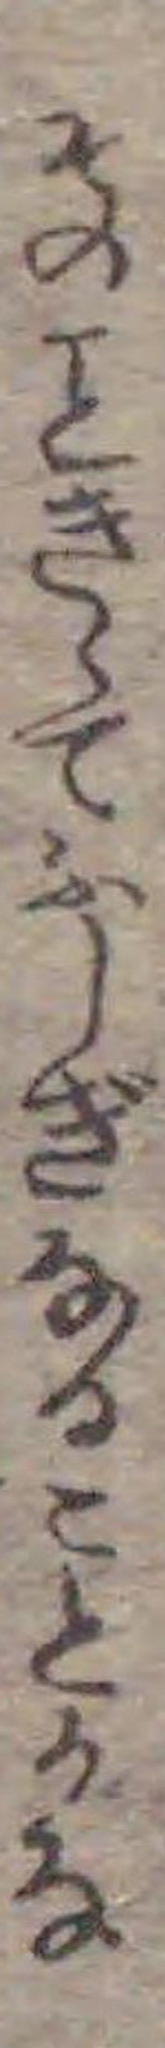そのこときゝてふしぎなることかな
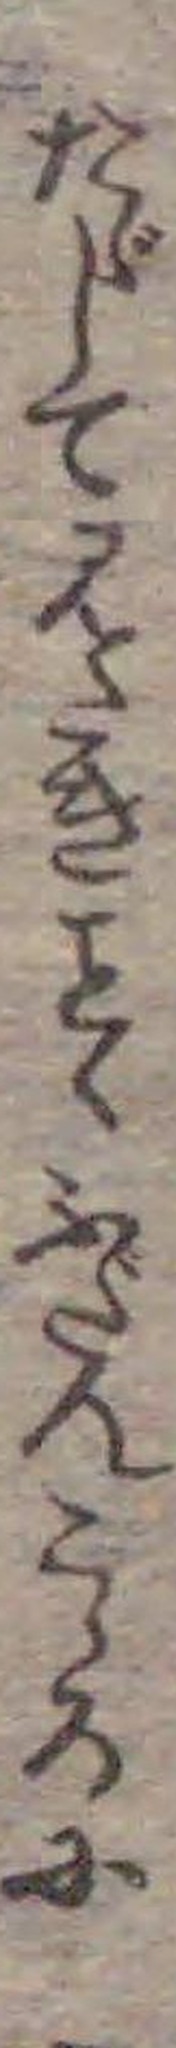たゞして見たきことゝふだんこゝろに
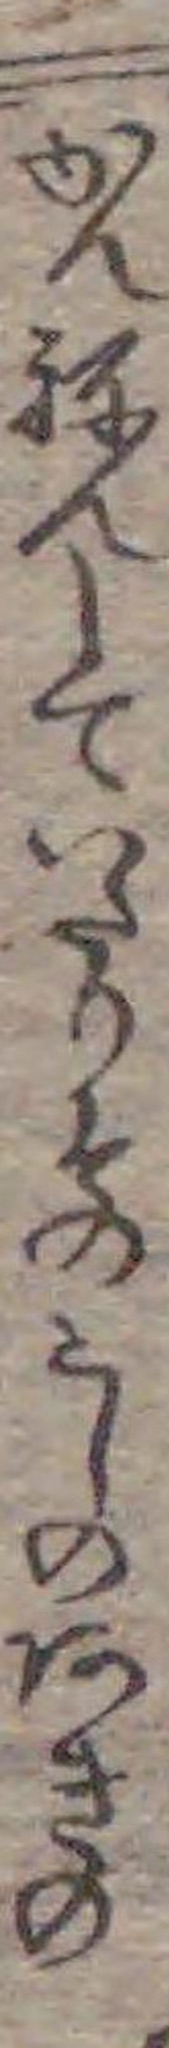かんねんしていたりそのとしのあきの
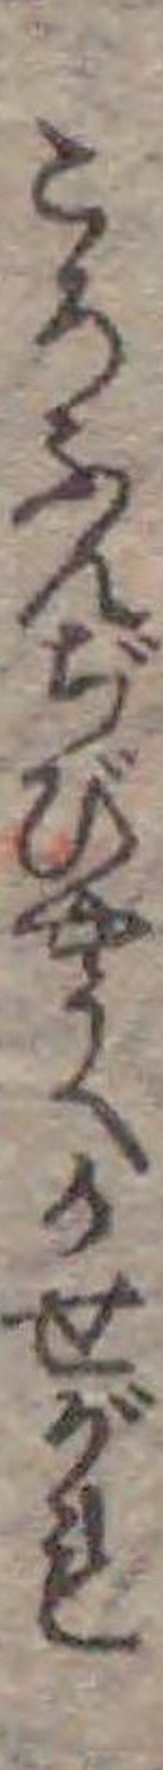ころふんぢびやうへかせがれ
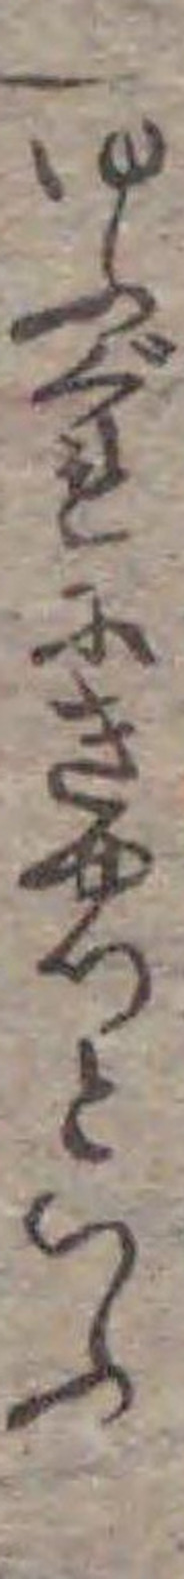ゆふぐれふきやつといふ
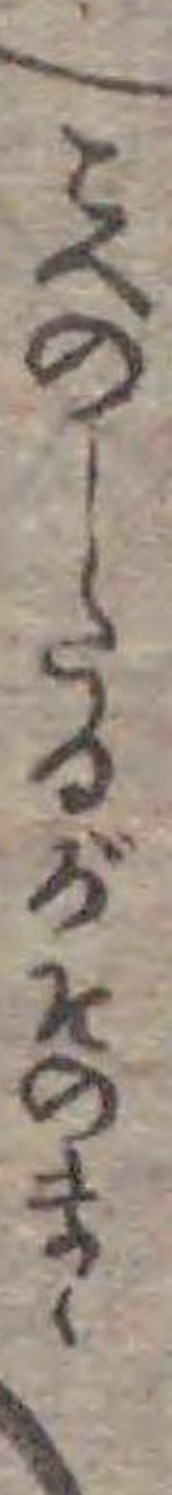こへのしたるがそのまゝ
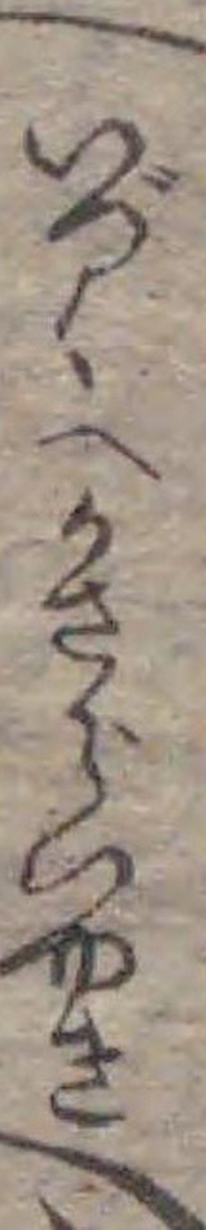いづくへかさらいゆき
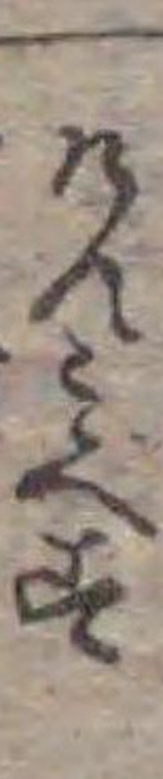けんみへす
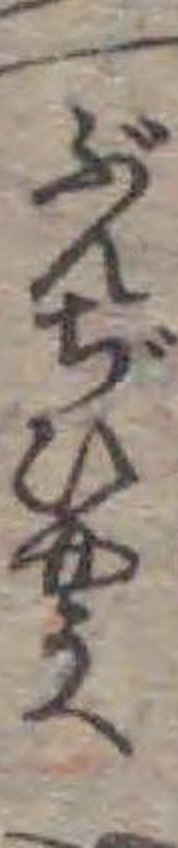ぶんぢひやうへ
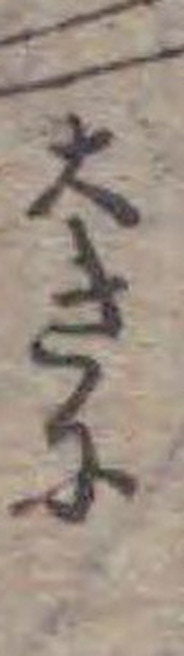大きに
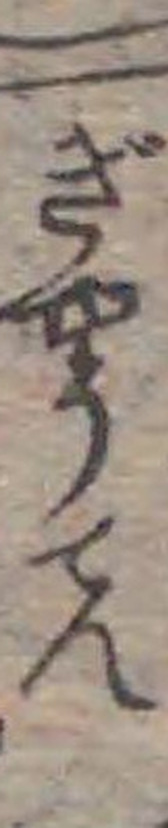ぎやうてん
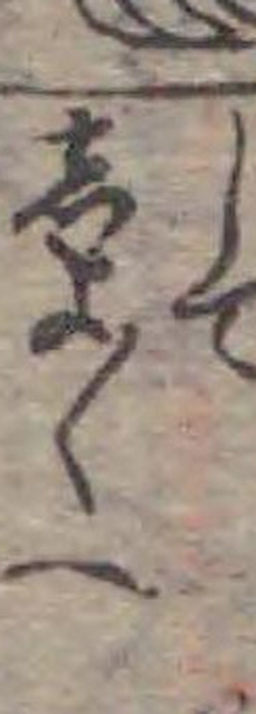しよ〳〵へ
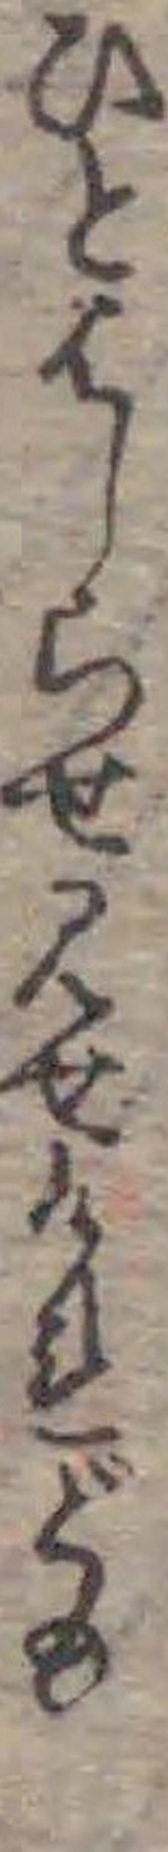ひとはしらせ見せけれども
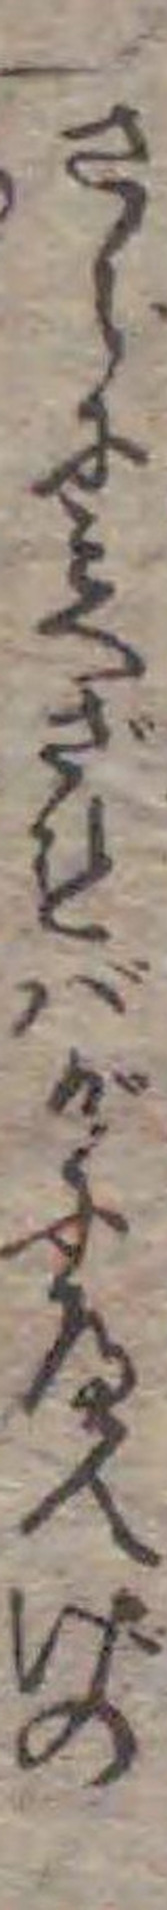さらにみへざればげにへんげの
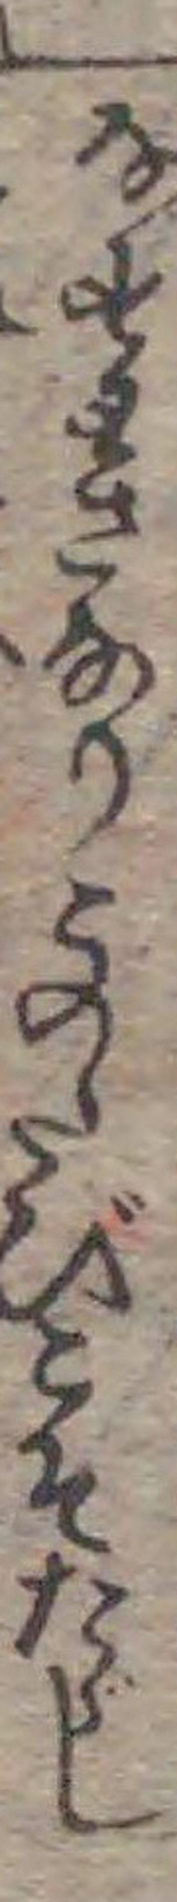なすわさなりこのたびこそたゞし
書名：変化物春遊 : 2巻
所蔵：国立国会図書館 National Diet Library, JAPAN
